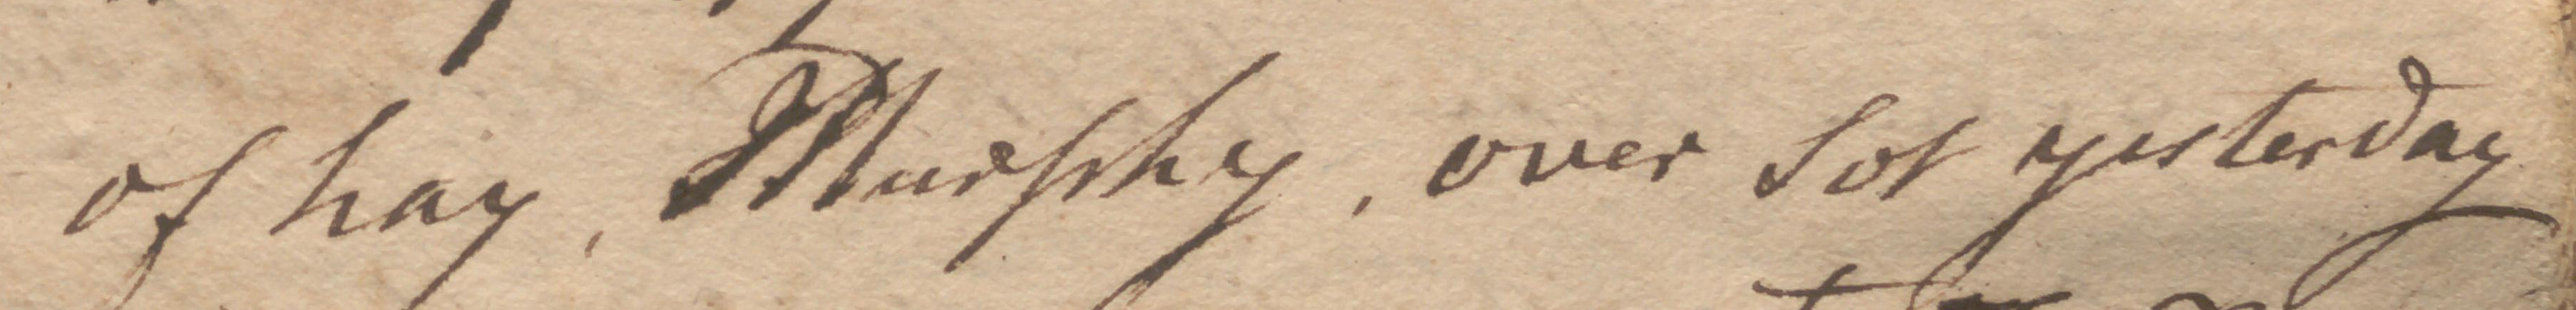of hay Murphy, over sot yesterday
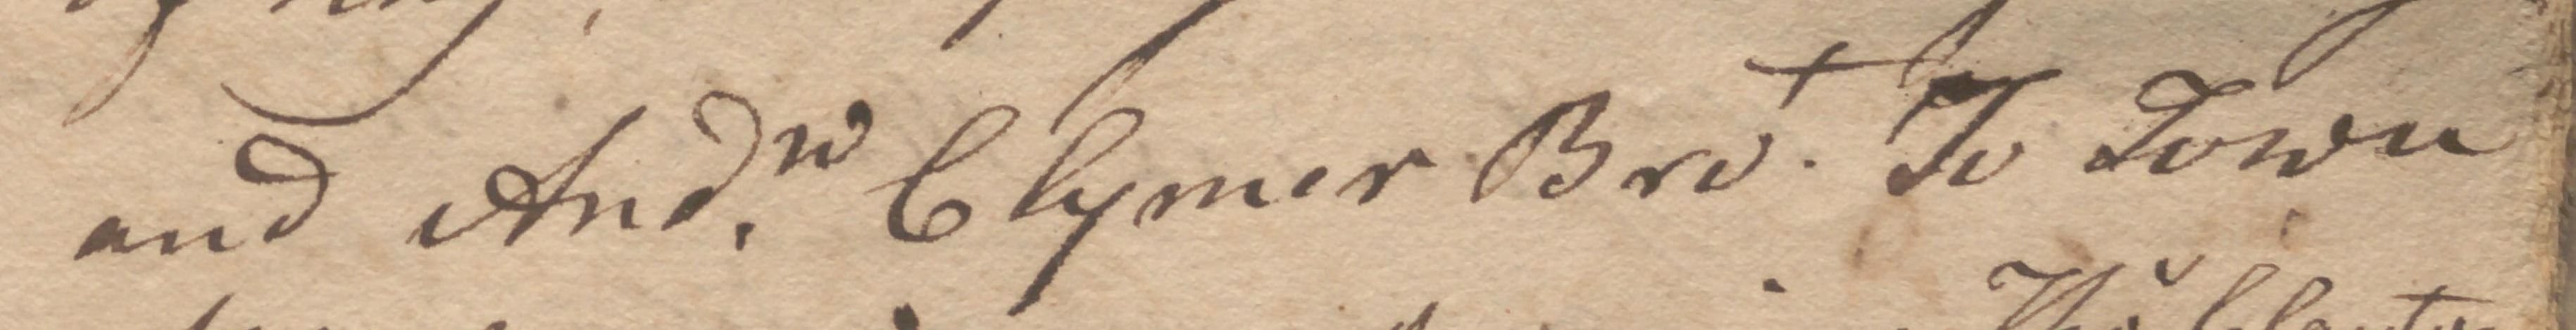and And^w. Clymer Bro^t. To Town
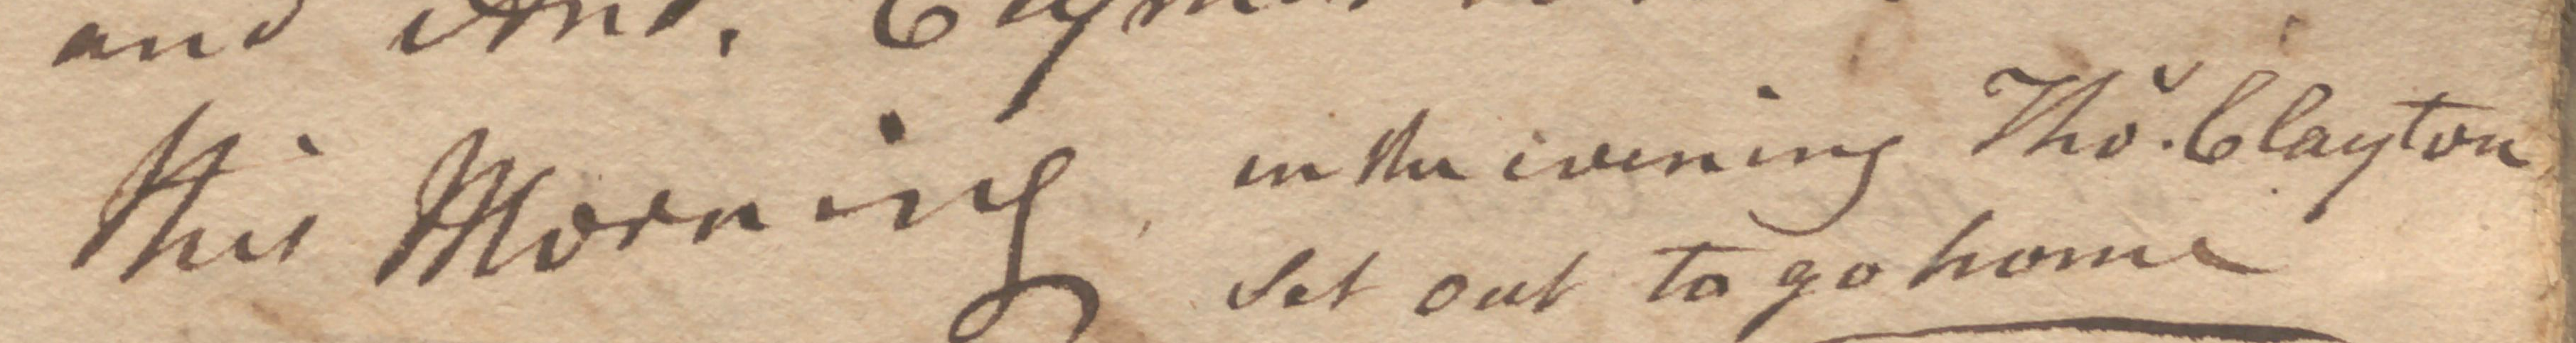this Morning in the evening Tho^s. Clayton
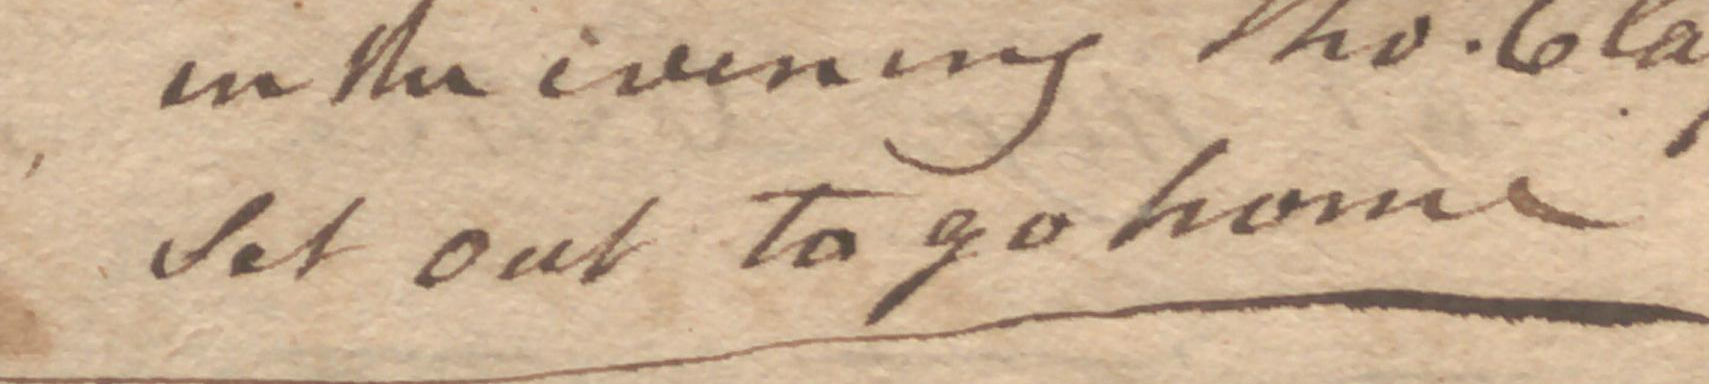set out to go home
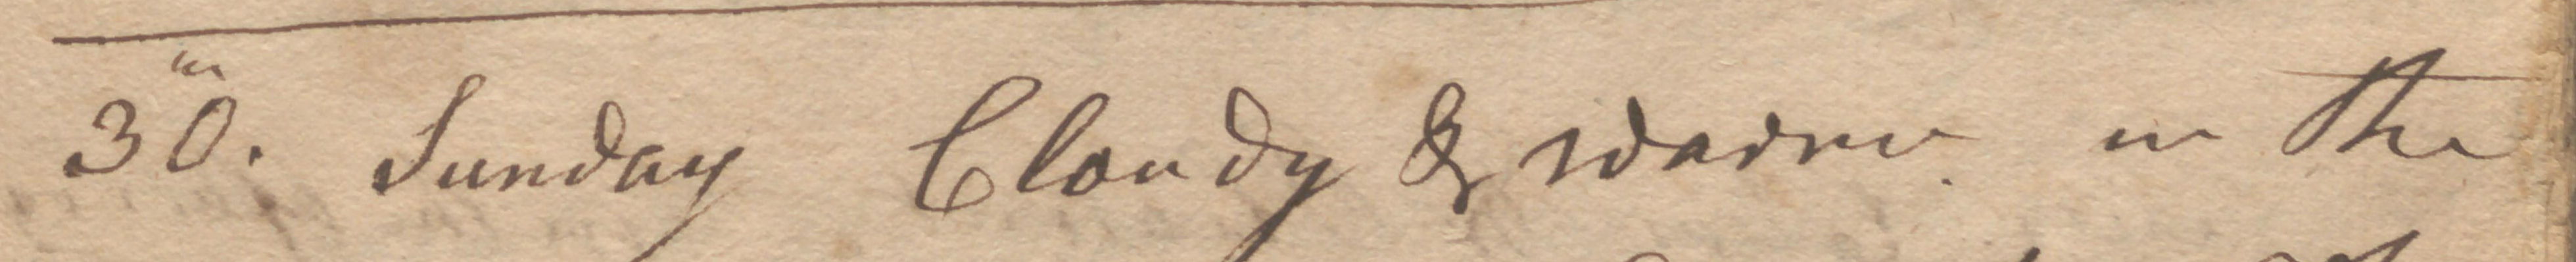30. Sunday Cloudy & warm in the
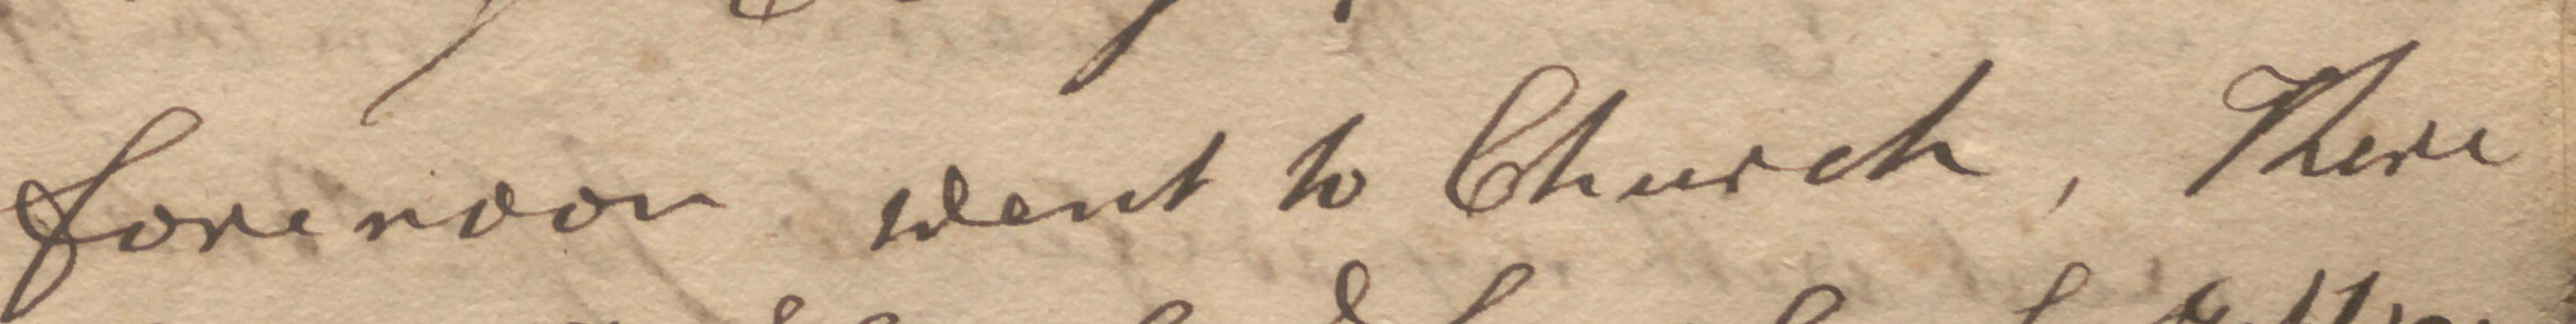forenoon went to Church, There
